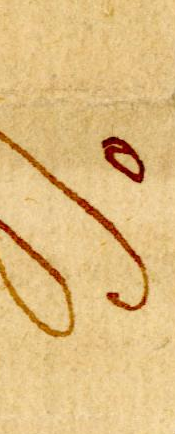To
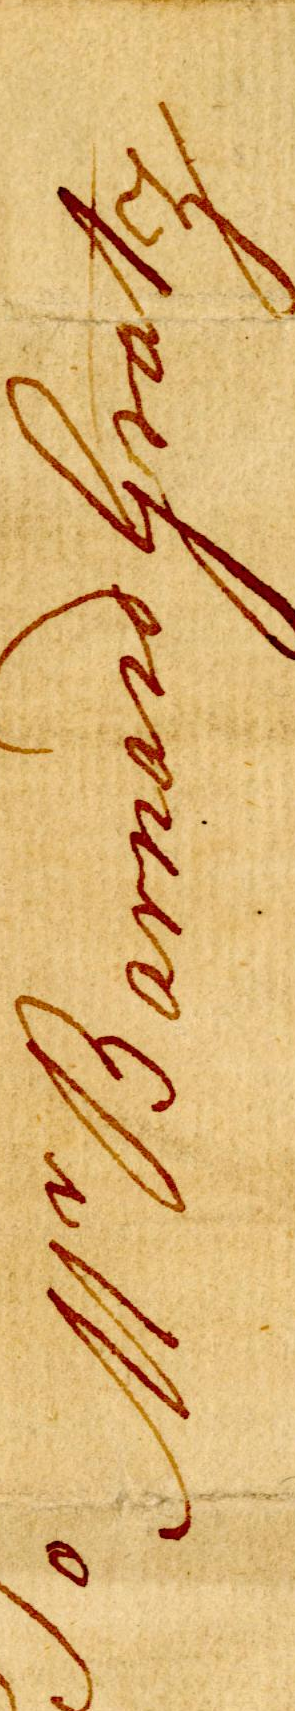M^r. Barnard Gratz
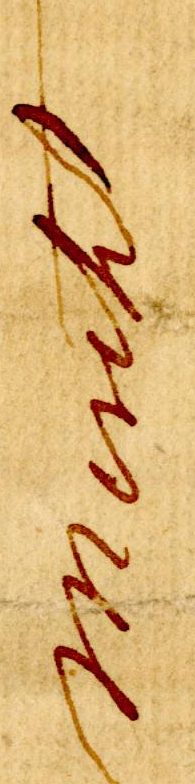merch^t
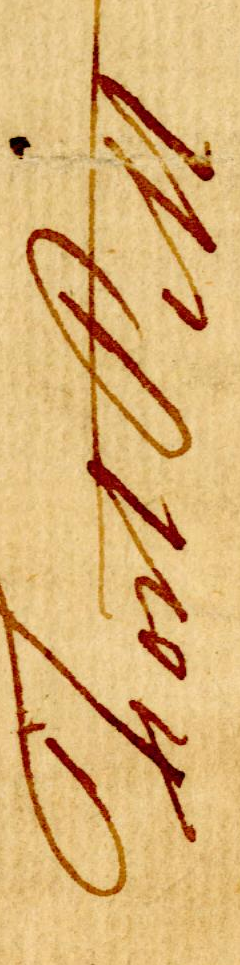Fort Pitt
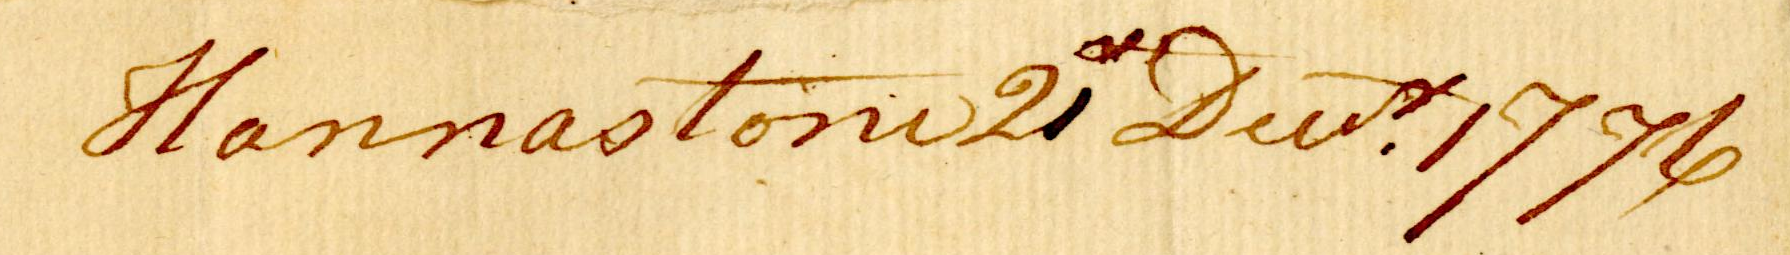Hannastow 21^st Dec^r. 1776
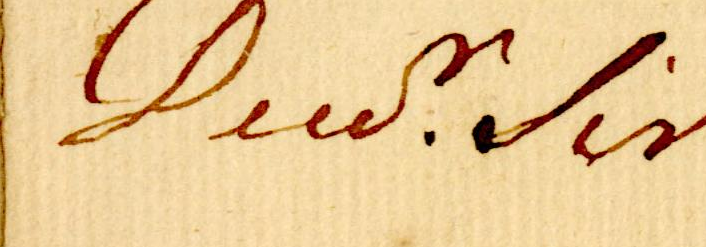Dea^r. Sir
